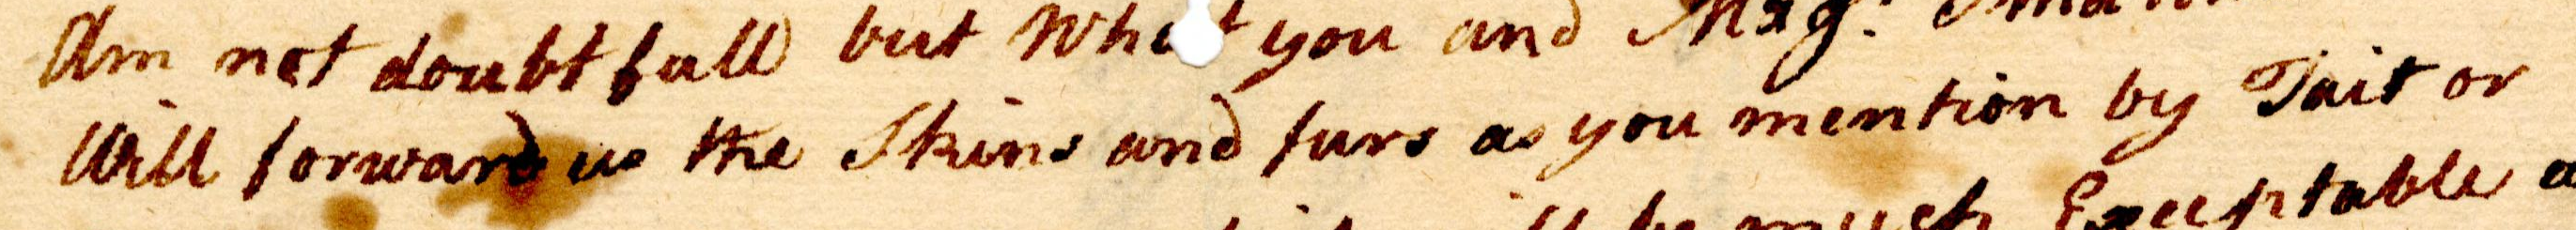will forward in the skins and furs as you mention by Tait or
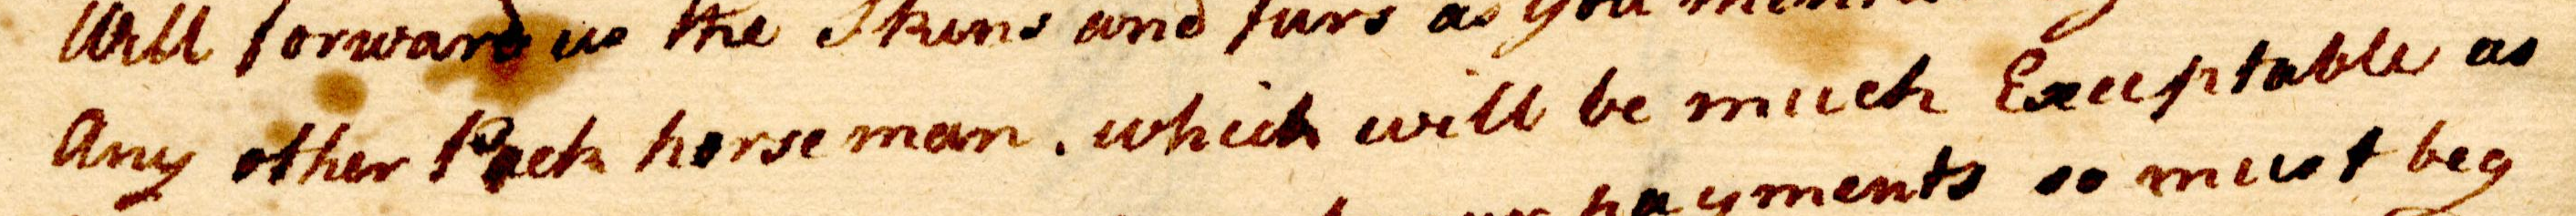any other Pack horseman. which will be much Exceptable as
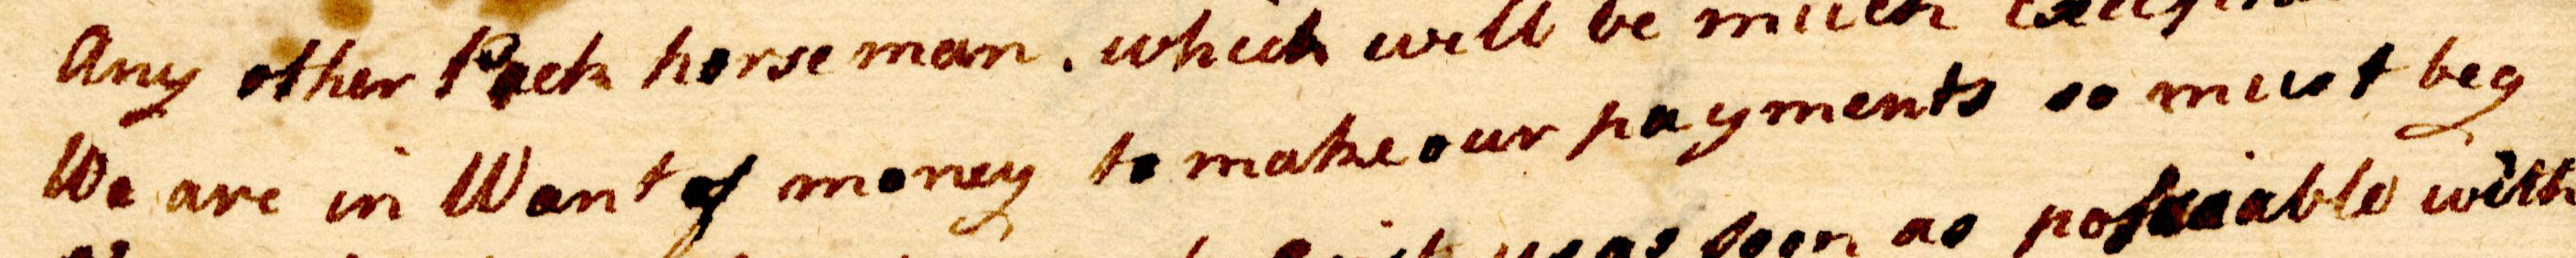We are in Want of money to make our payments so must beg
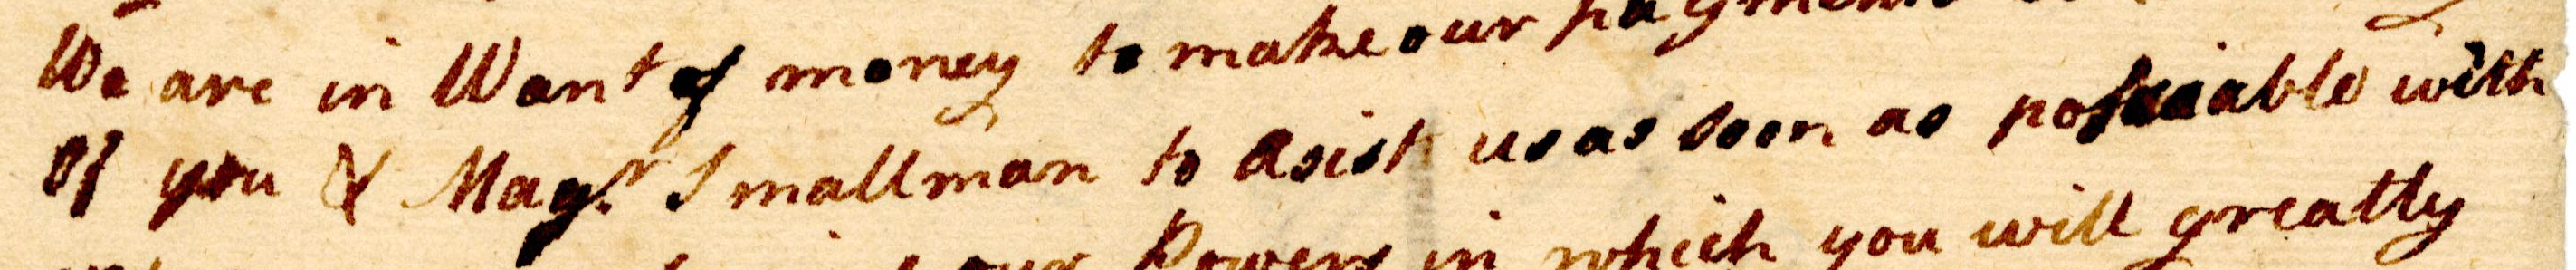8s you & Mag^r. Smallman to asist us as soon as posseable with
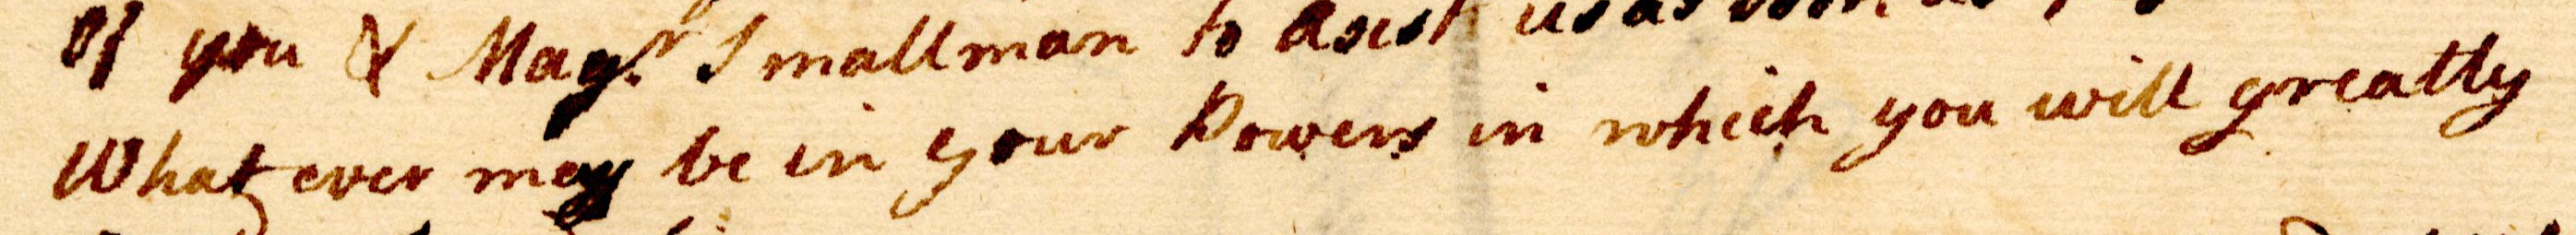whatever may be in your powers in which you will greatly
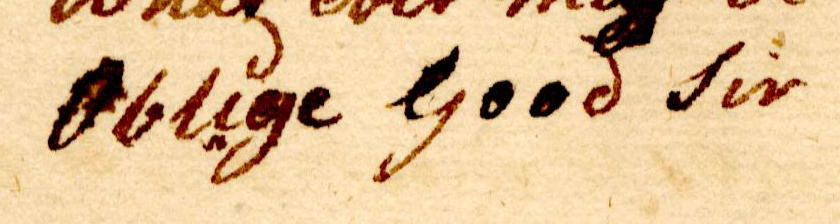Oblige good Sir
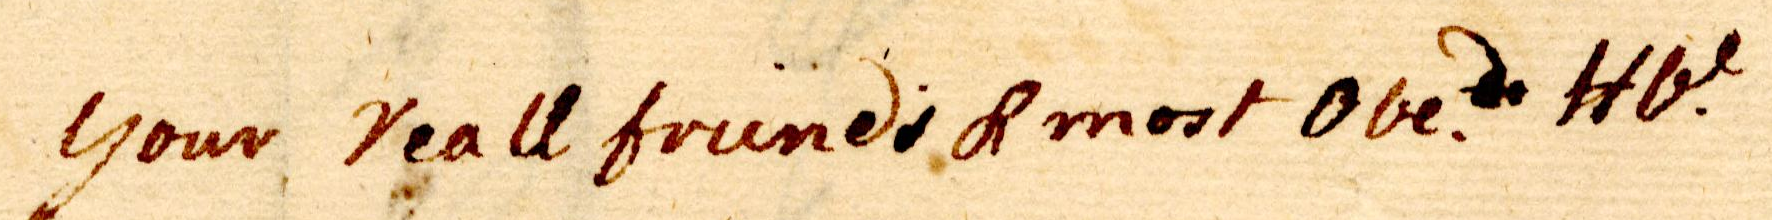Your reall friends & most obe^d H^bl.
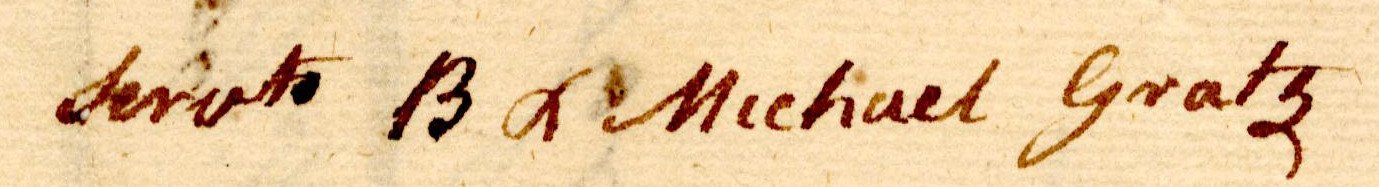serv^ts B & Michael Gratz
